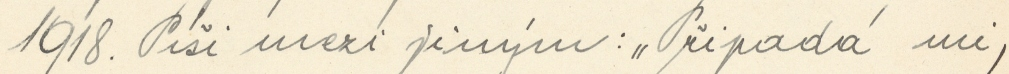1918. Píši mezi jiným: „Připadá mi,
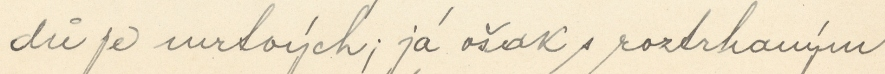dů je mrtvých; já však s roztrhaným
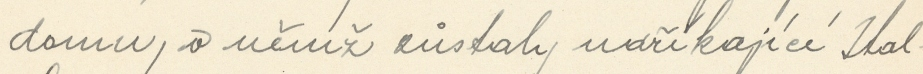domu, v němž zůstaly naříkající Ital-
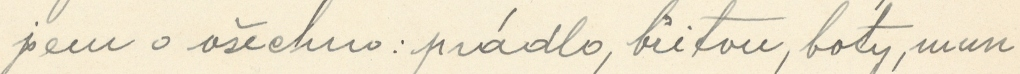jsem o všechno: prádlo, břitvu, boty, mun-
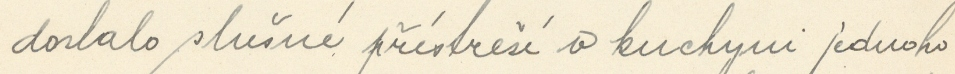dostalo slušné přístřeší v kuchyni jednoho
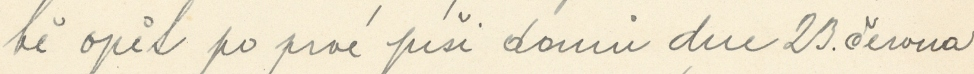bě opět po prvé píši domů dne 23. června
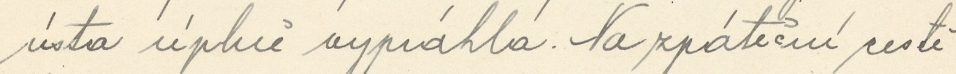ústa úplně vypráhlá. Na zpáteční cestě
